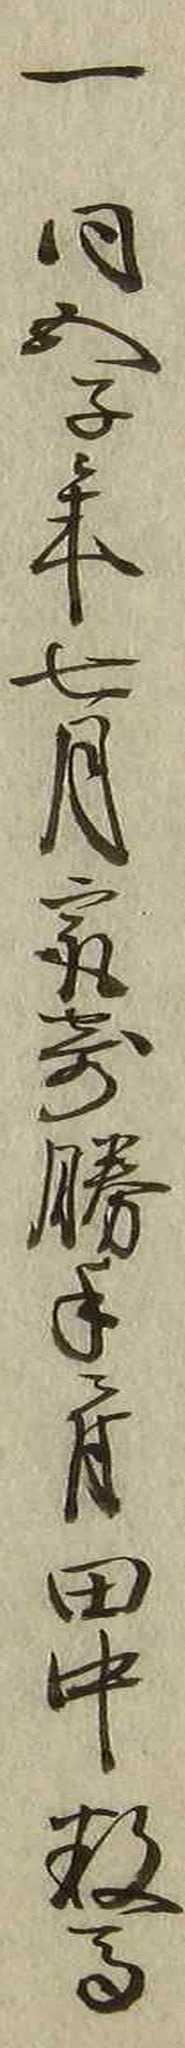一同五子年七月最寄勝手ニ付田中数馬
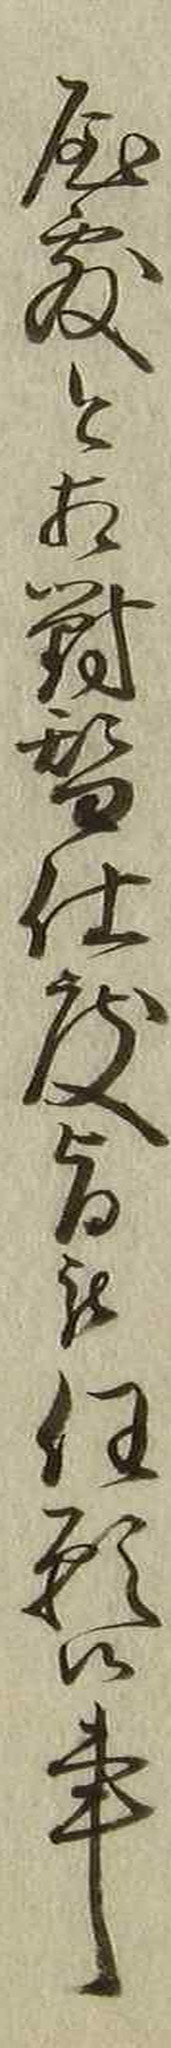屋敷と相対替仕度旨被伺願候事
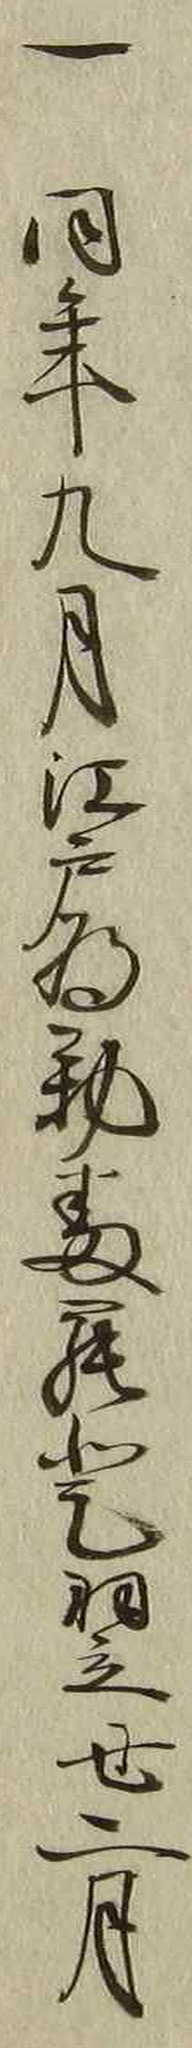一同年九月江戸為勤番罷登翌丑二月
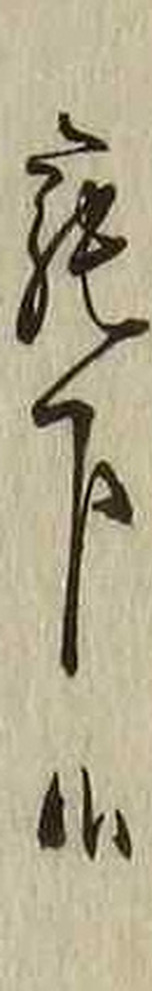罷下候
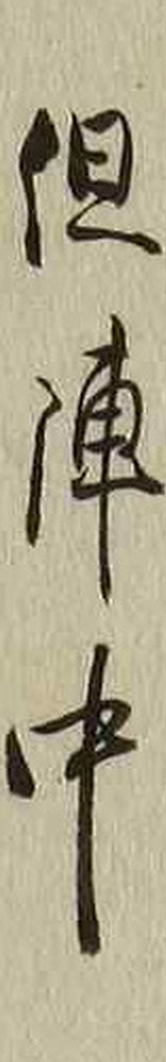但陣中
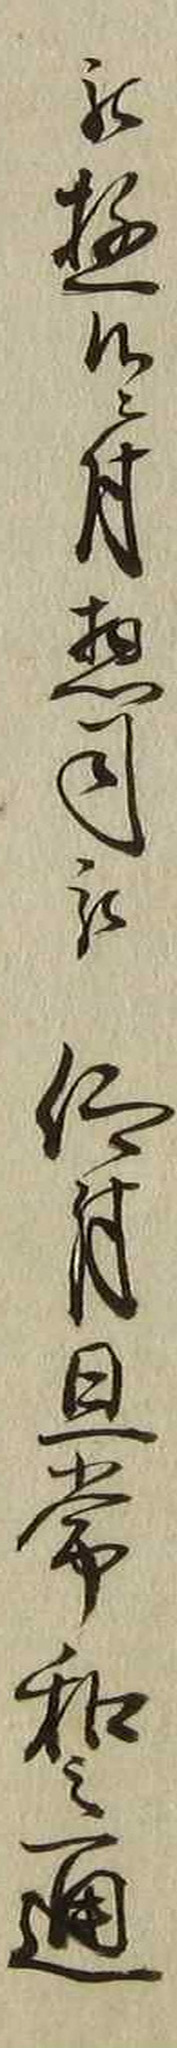被遊候ニ付惣司被仰付且常和之通
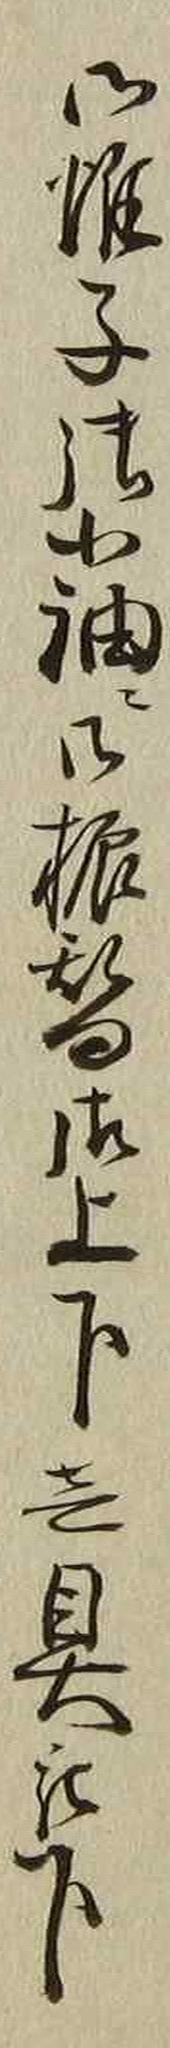御帷子御小袖ニ御振替御上下壱具被下
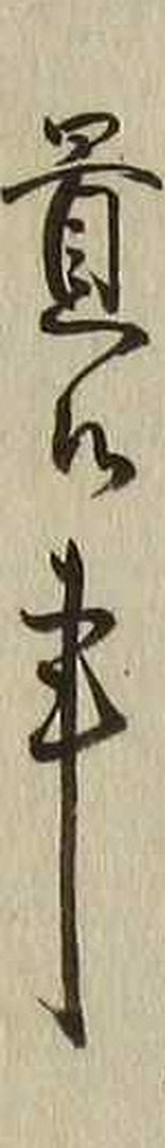置候事
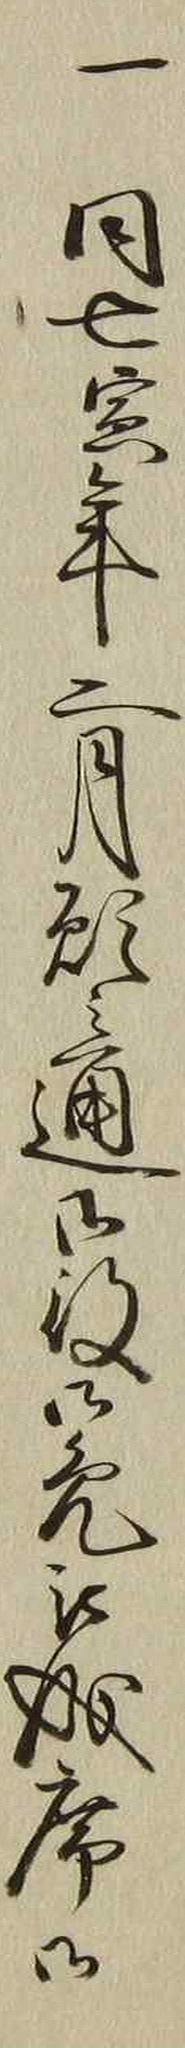一同七寅年二月願之通御役御免被成序御
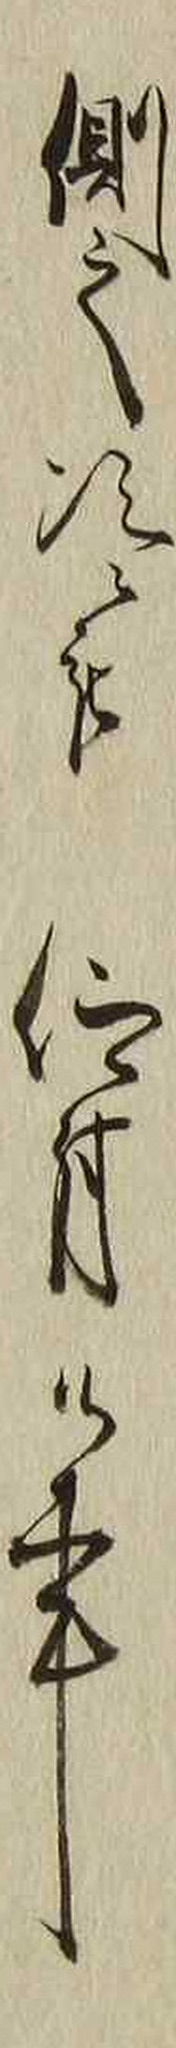側之次ニ被仰付候事
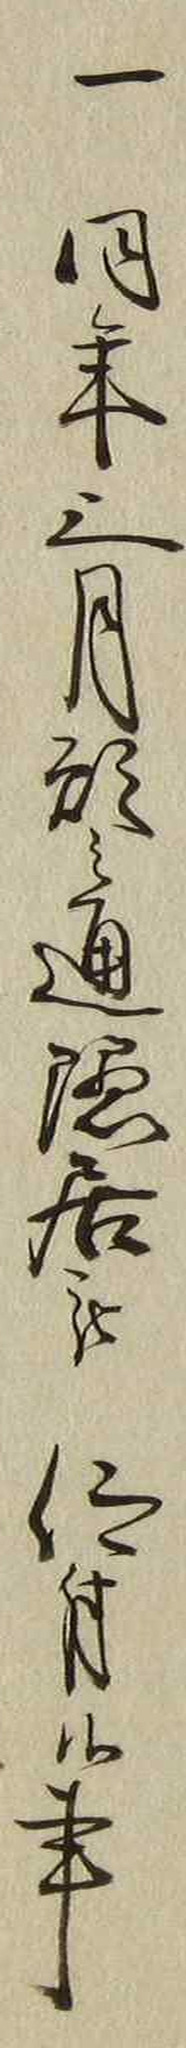一同年三月願之通隠居被仰付候事
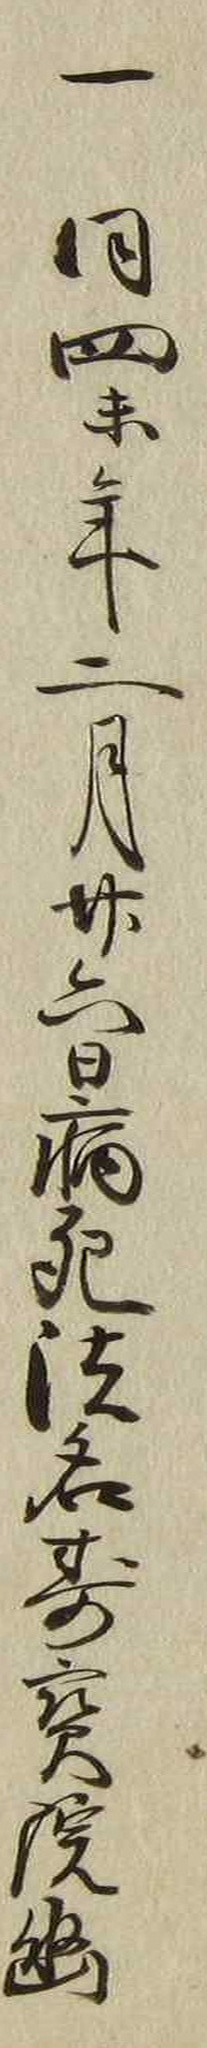一同未年二月廿六日病死法名寿宝院幽
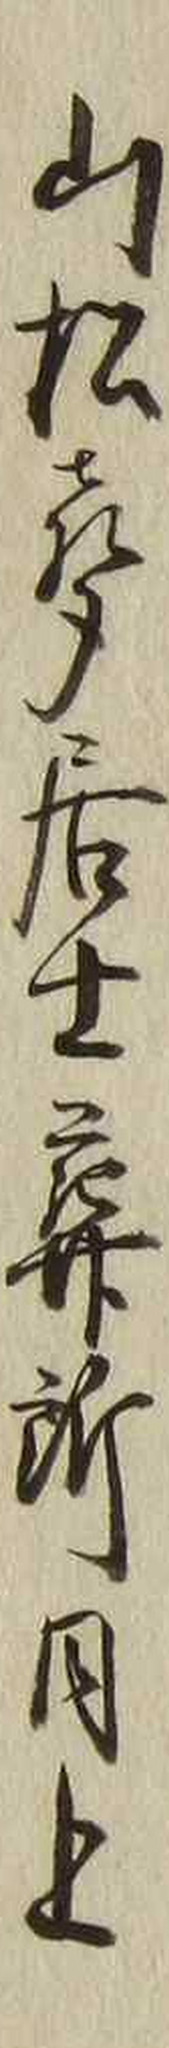山松声居士葬所同上

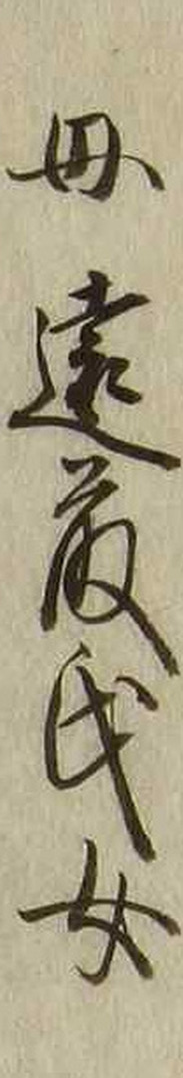母遠藤氏女
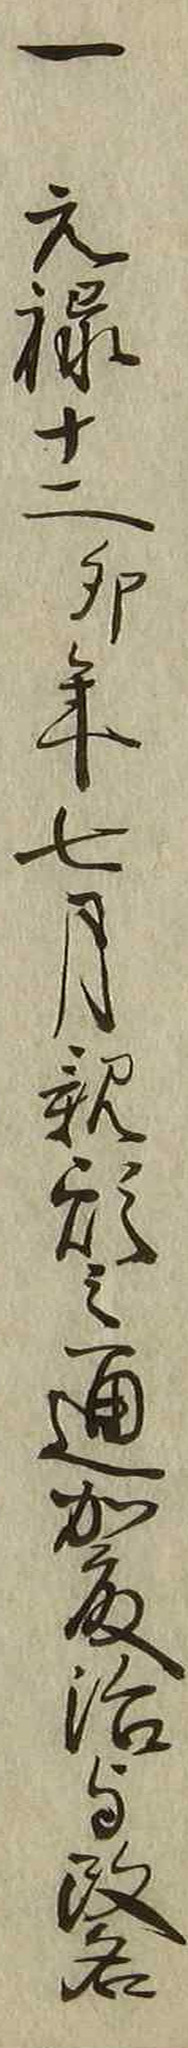一元禄十二卯年七月親願之通加藤治与改名
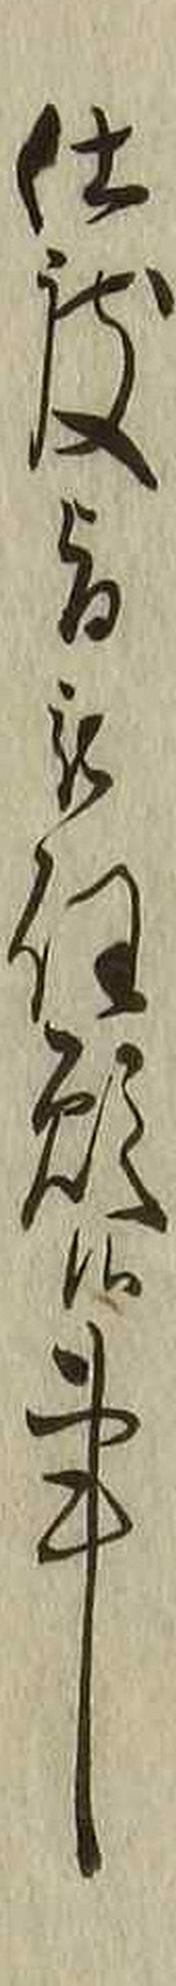仕度旨被伺願候事
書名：諸士系譜　巻之65　ち之部1
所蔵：会津若松市立会津図書館
